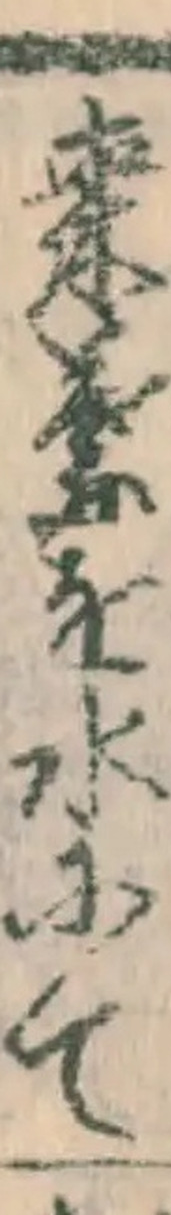桑葉を水にて
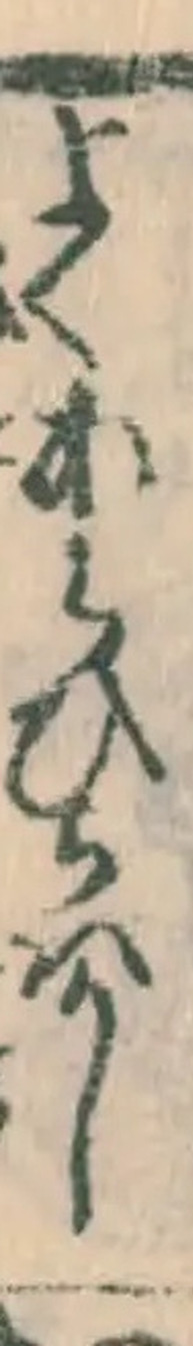よくあらひかはかし
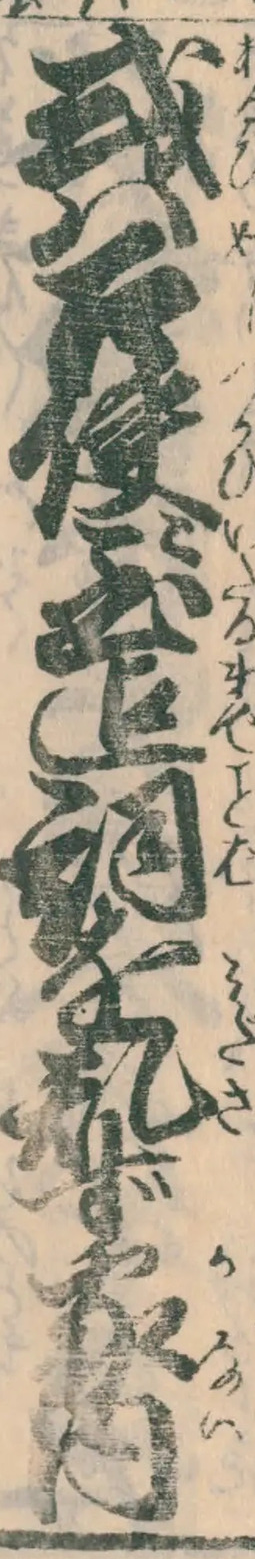或は召使に至迄詞を乱ず家内
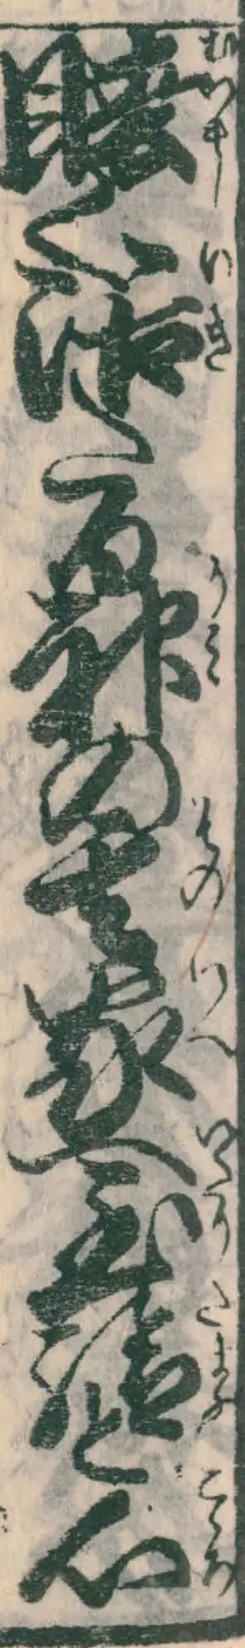睦く活たる神の其家へ至給と心
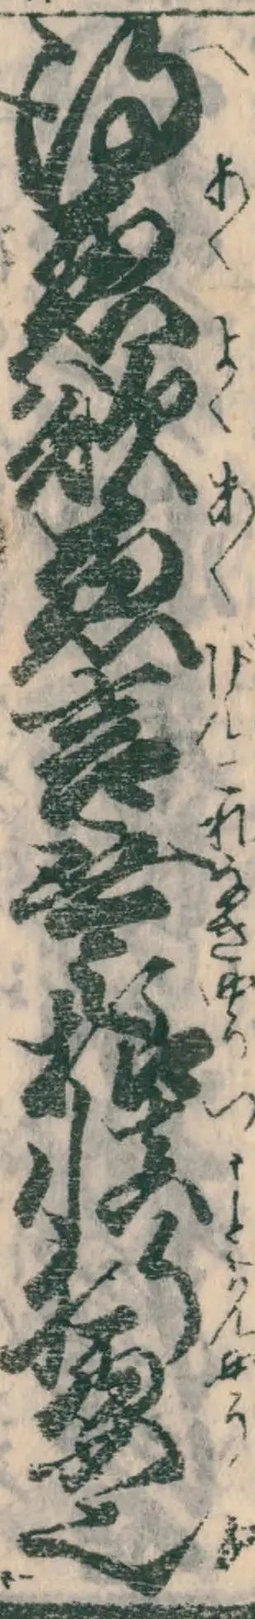得悪欲悪言無之様慎肝要也
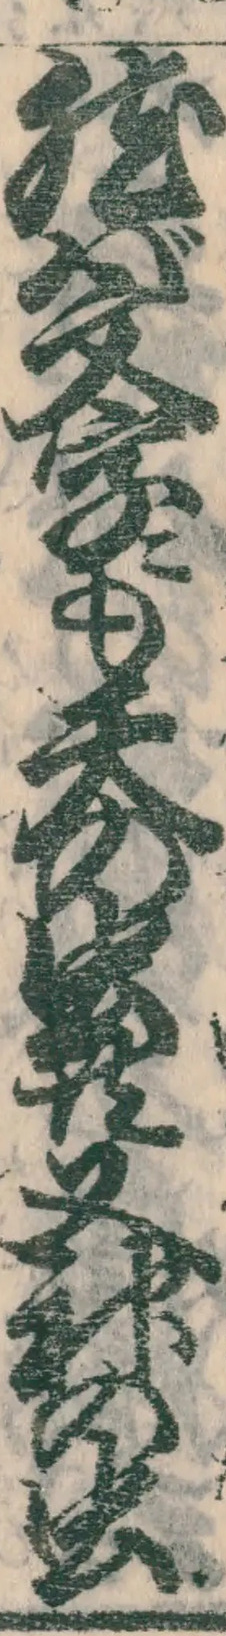然ば文字にも天の虫共又神の虫
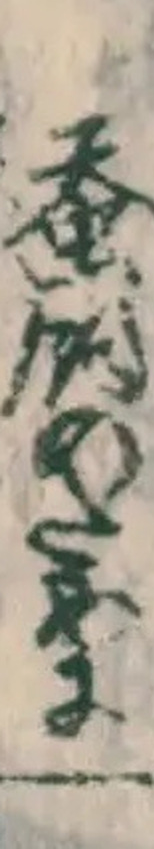蚕飼のために
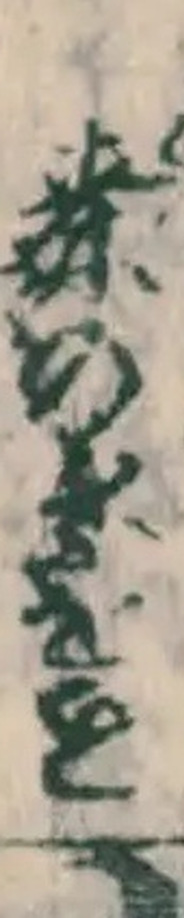桑の葉をと
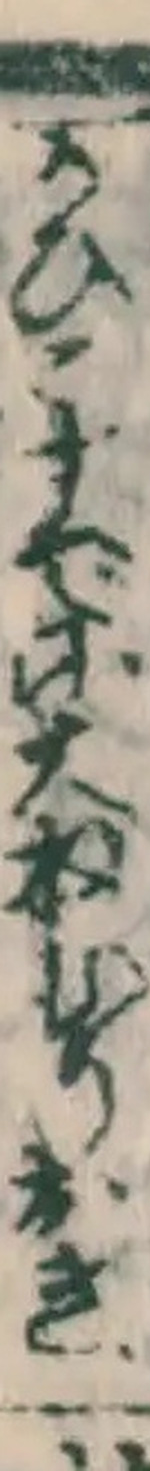「かひこすでに大ねむりおき
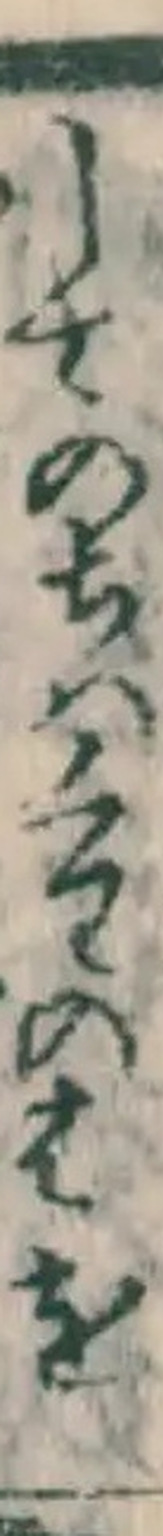してのちはくわのはを
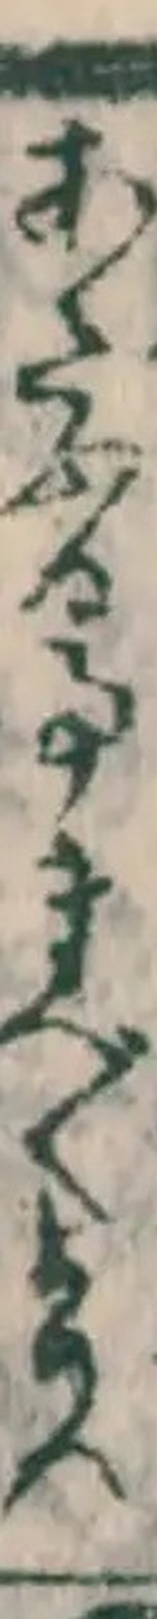あたふる事まへ〳〵よりは
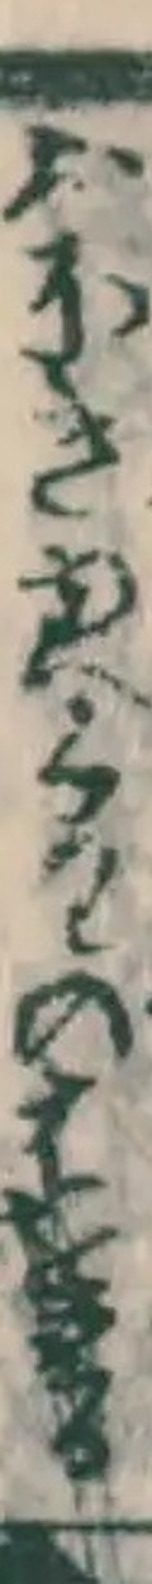おほきゆへ桑の葉をとる
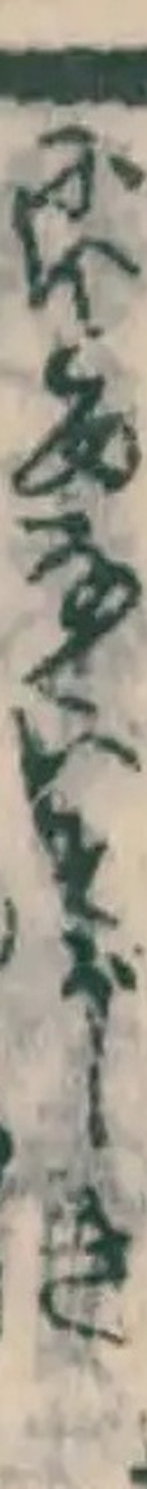にいとまなくいそがしき
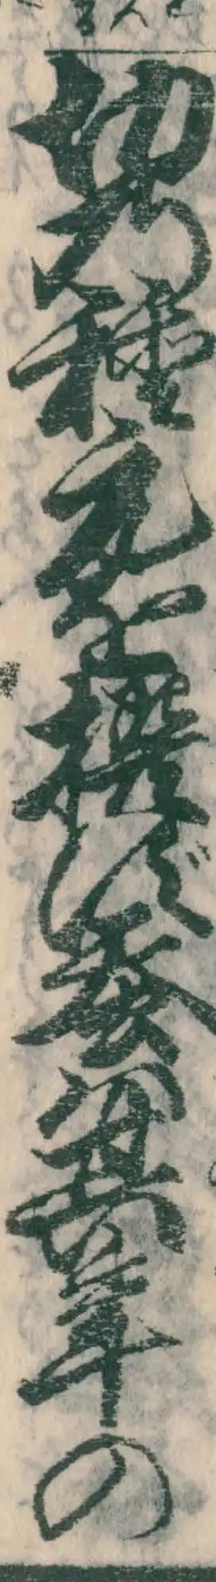切の種元を撰ず蚕は其年の
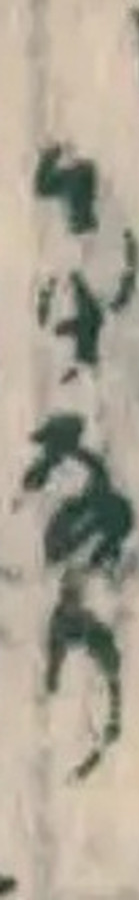事なり

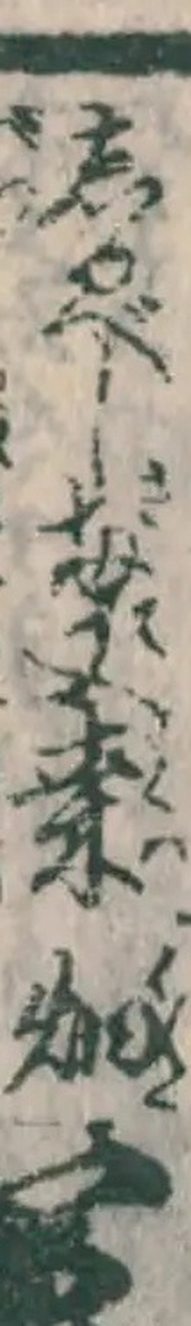しるべし。扨又桑畑
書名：養蚕往来
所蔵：国立国会図書館 National Diet Library, JAPAN
